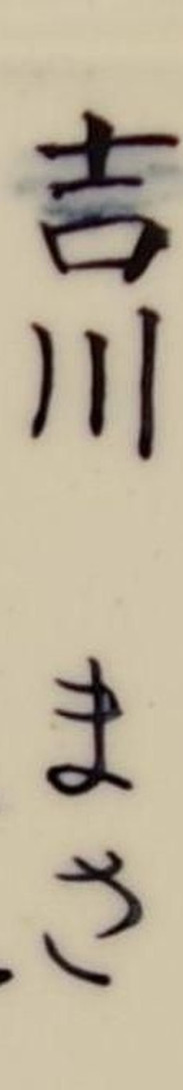吉川まさ
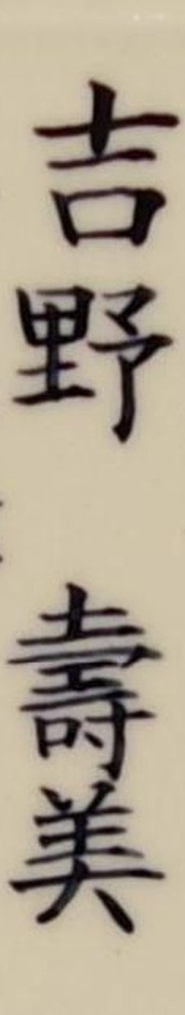吉野壽美
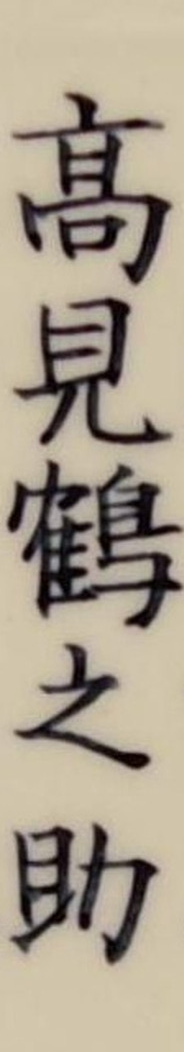高見鶴之助
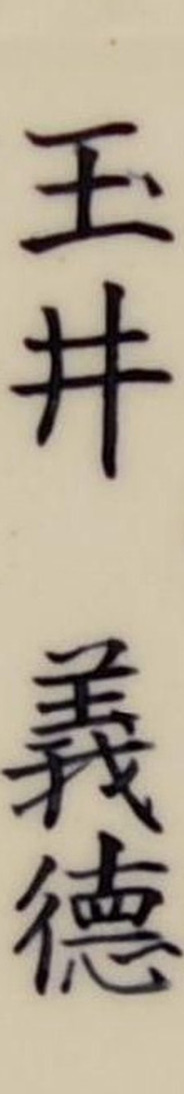玉井義徳
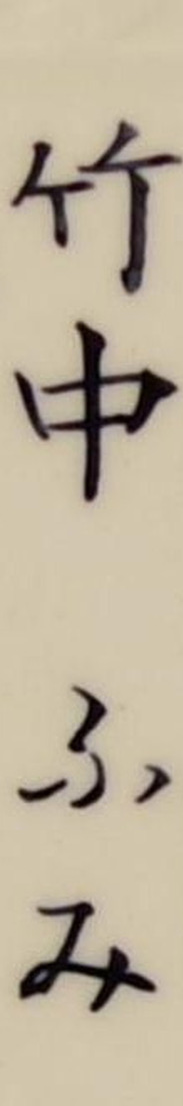竹中ふみ
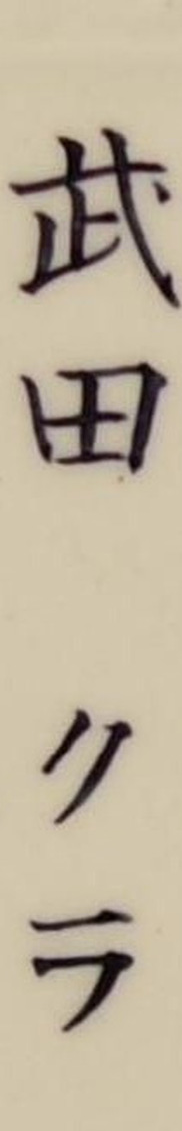武田クラ
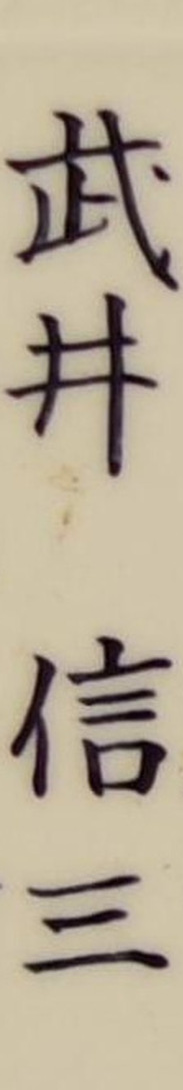武井信三
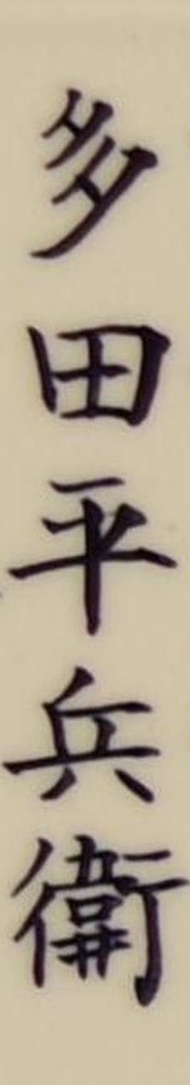多田平兵衛
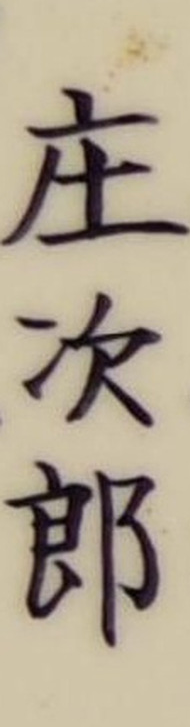庄次郎
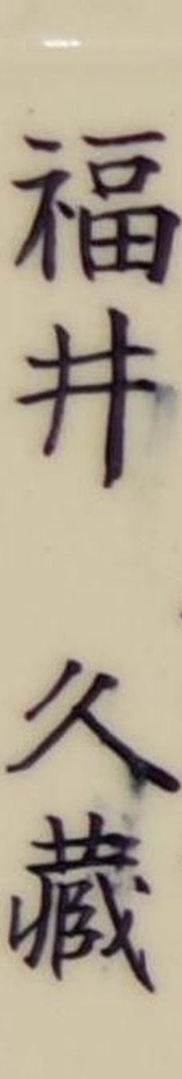福井久蔵
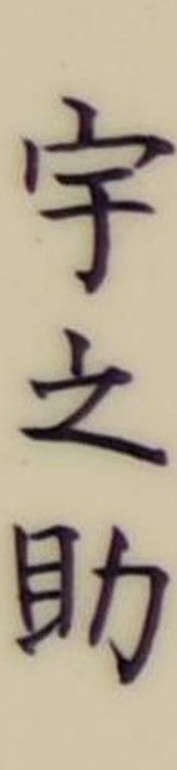宇之助
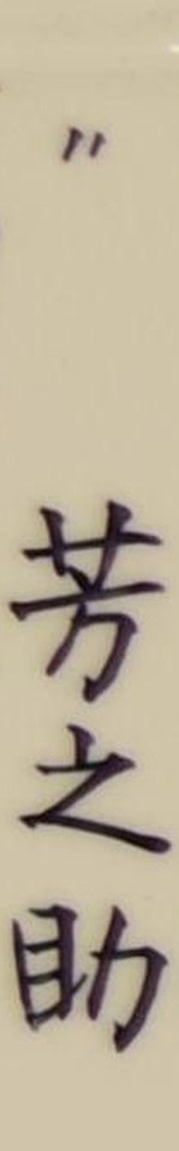芳之助
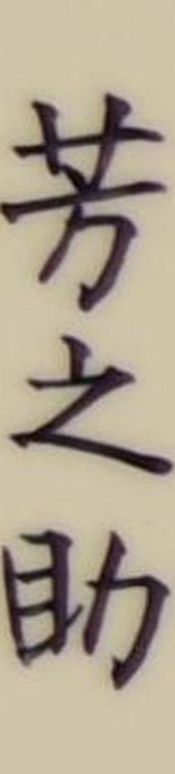芳之助
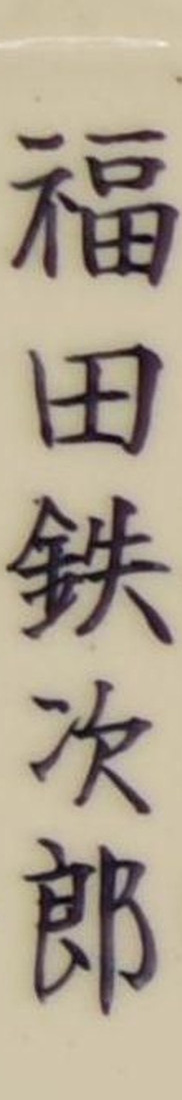福田鉄次郎
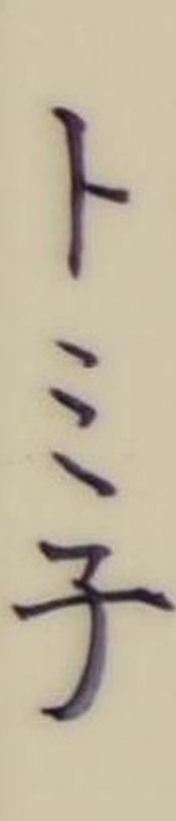トミ子

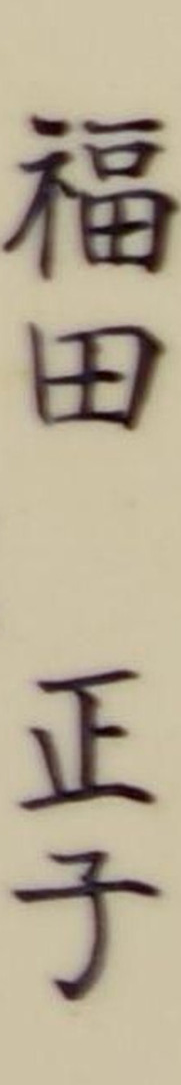福田正子
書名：E~L
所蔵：高野山金剛峯寺
